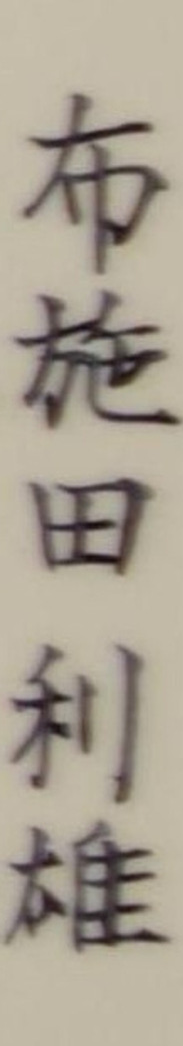布施田利雄
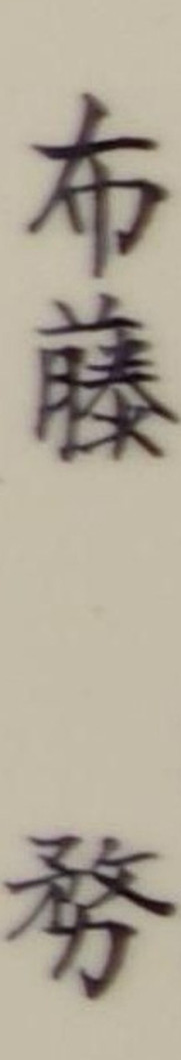布藤努
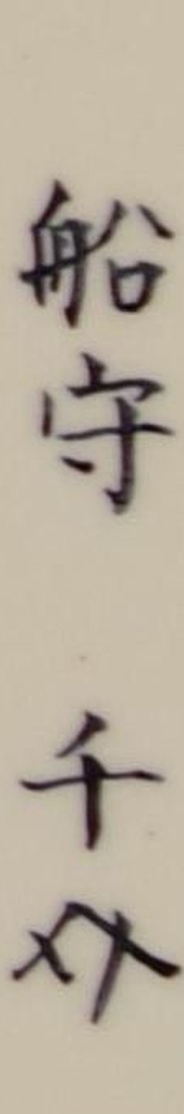船守千介
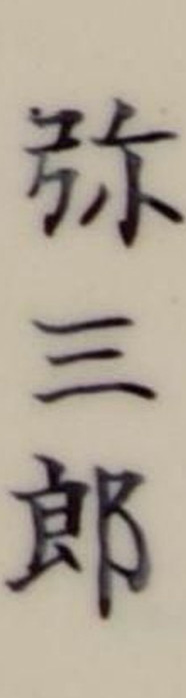弥三郎
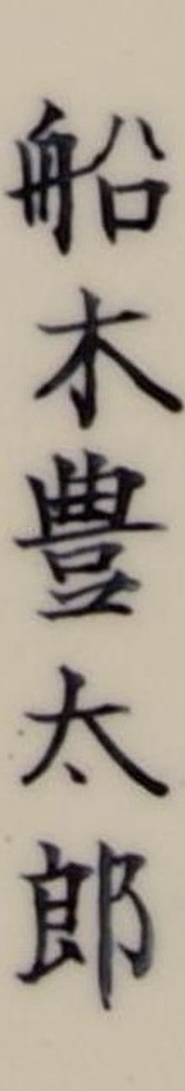船木豊太郎
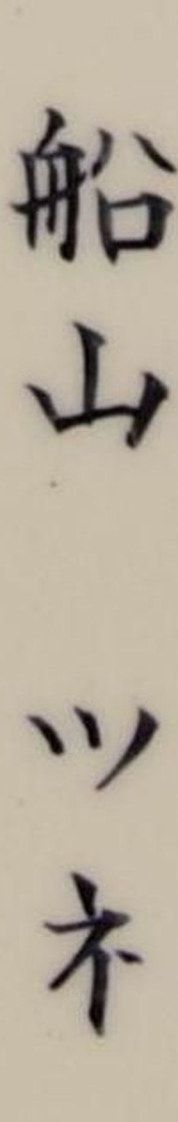船山ツネ
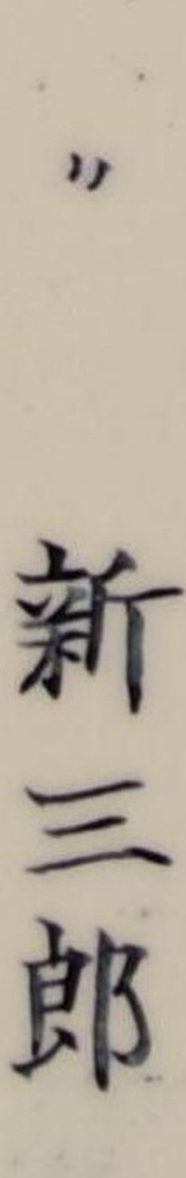新三郎
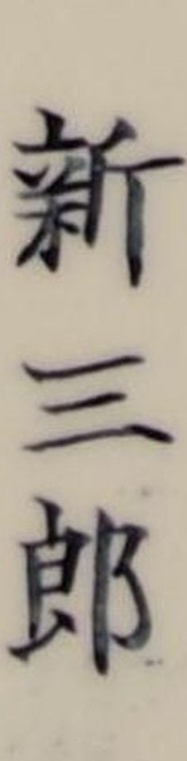新三郎
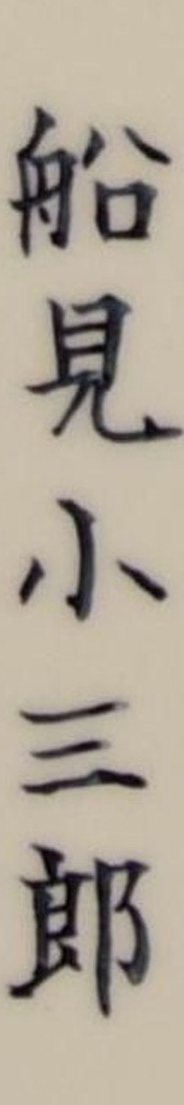船見小三郎
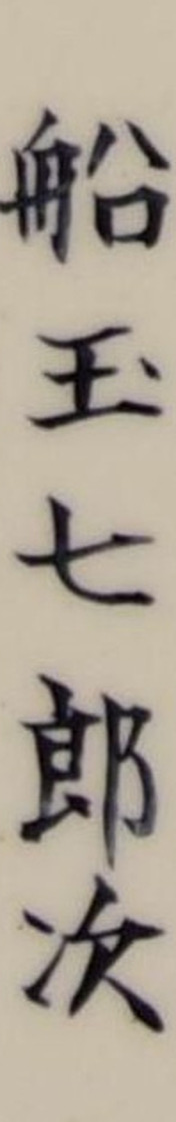船玉七郎次
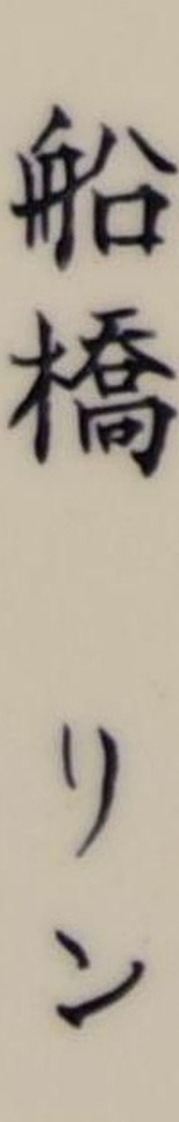船橋リン
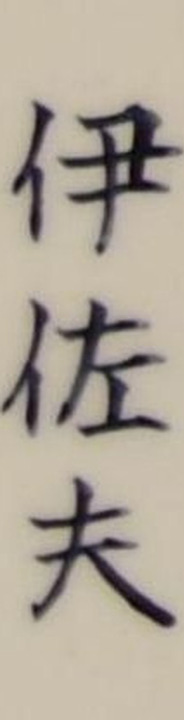伊佐夫

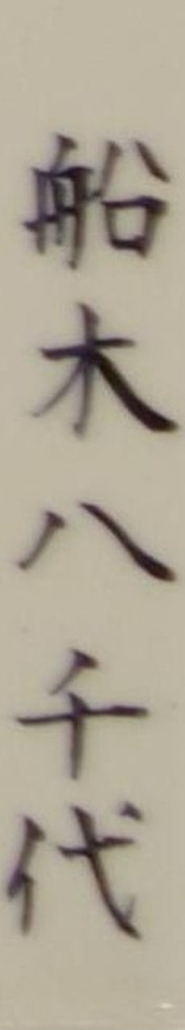船木八千代
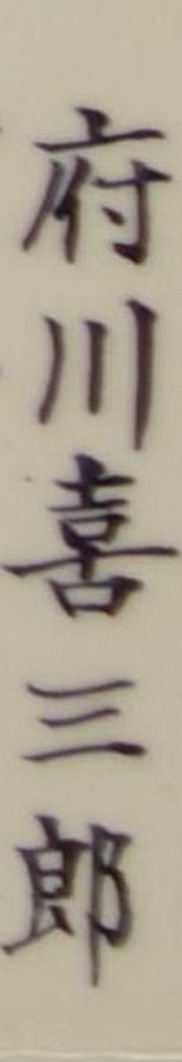府川喜三郎
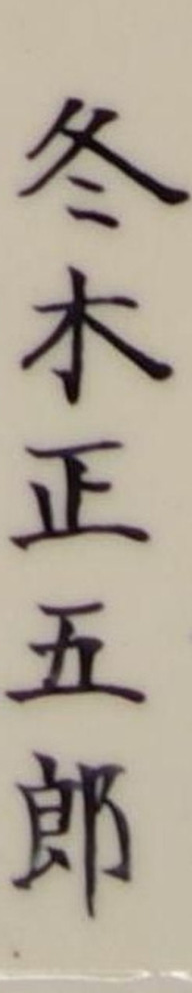冬木正五郎
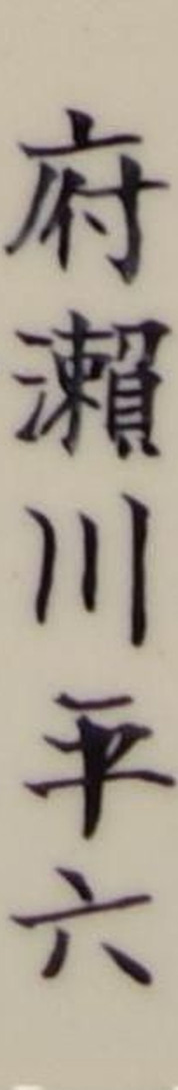府瀬川平六
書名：E~L
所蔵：高野山金剛峯寺
